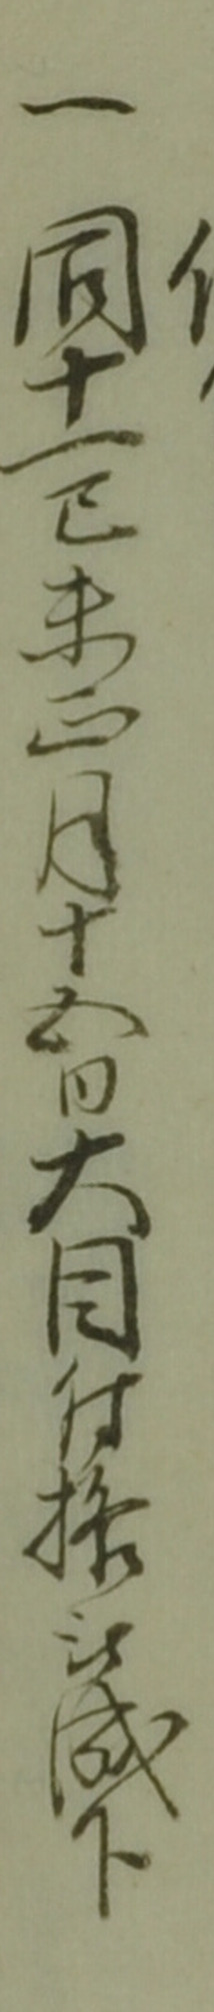一同十一己未正月十五日大目付格被成下
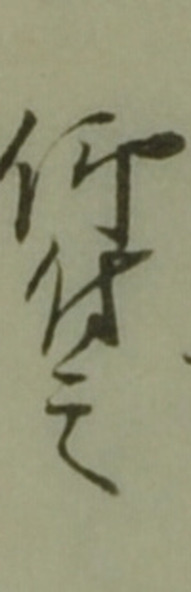仰付之
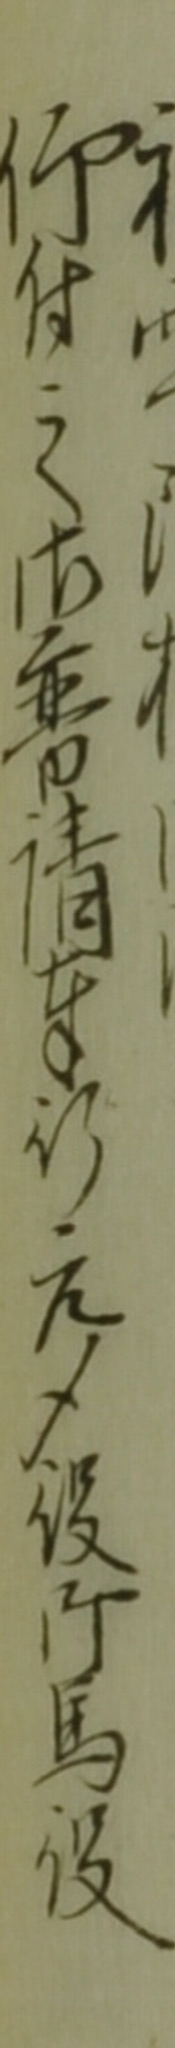仰付之御普請奉行元〆役御馬役
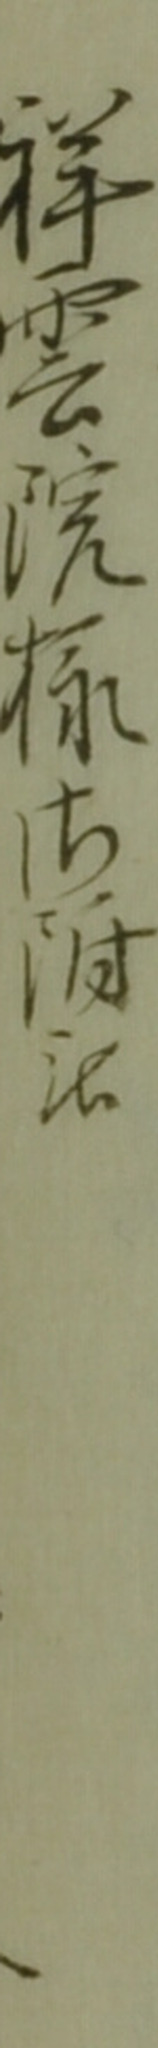祥雲院様御附被
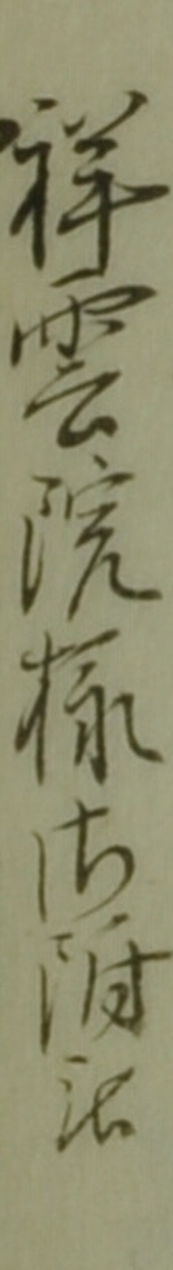祥雲院様御附被
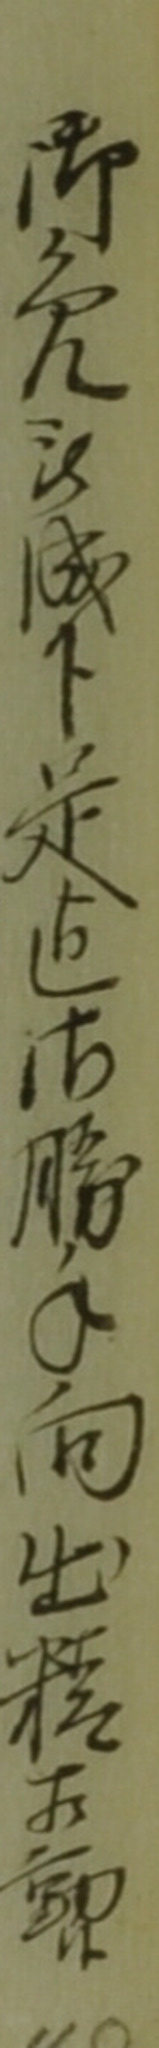御免被成下是迄御勝手向出精相勤候
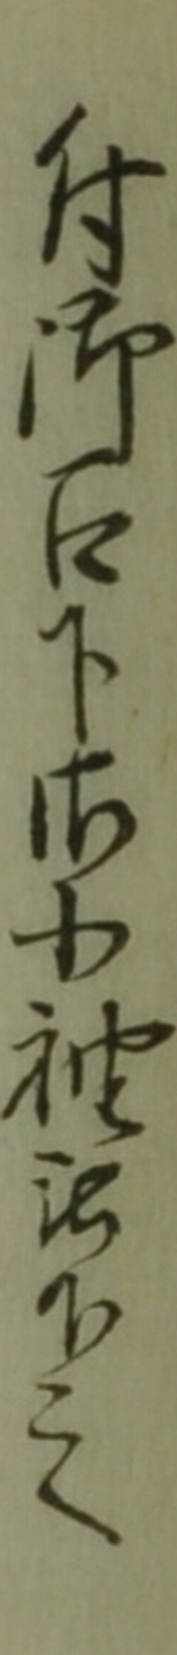付御召下御小袖被下之
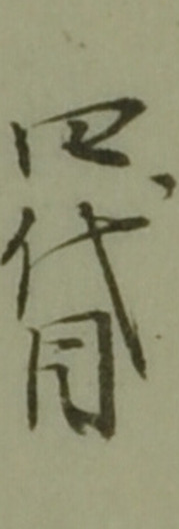四代目
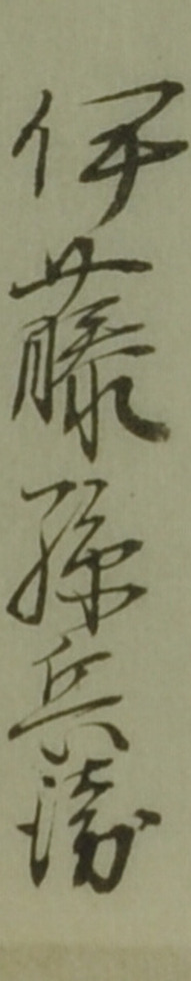伊藤孫兵衛
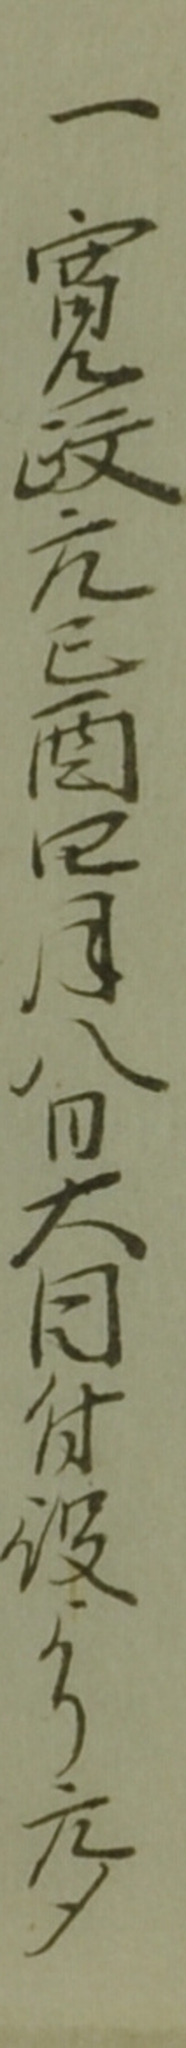一寛政元己酉四月八日大目付役より元〆
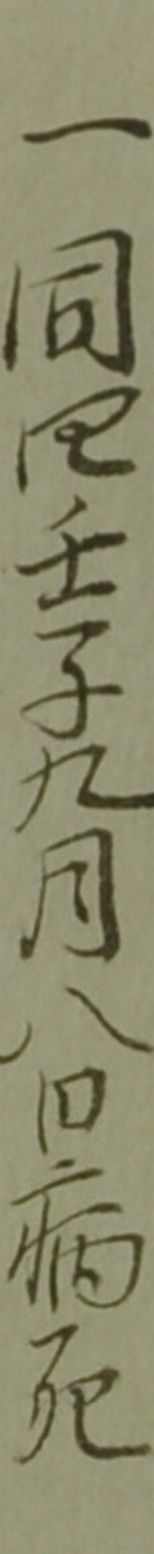一同四壬子九月八日病死
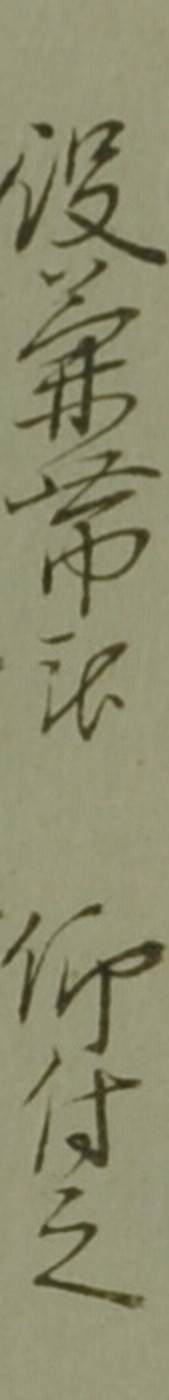役兼帯被仰付之
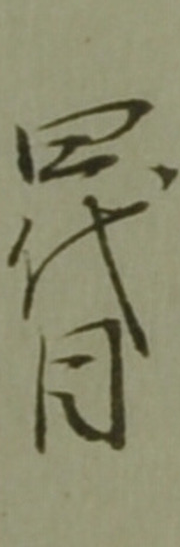四代目
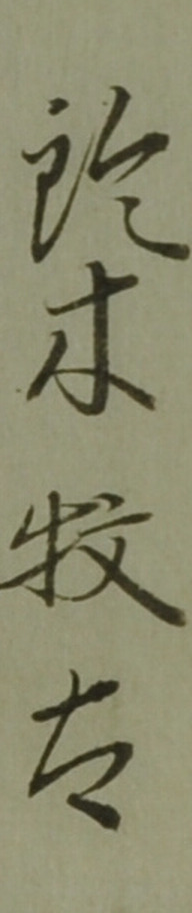鈴木牧太
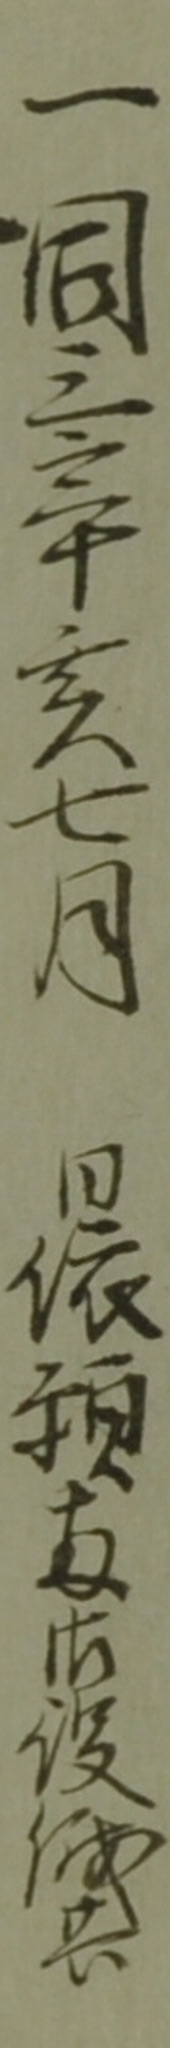一同三辛亥七月日依願両御役儀共
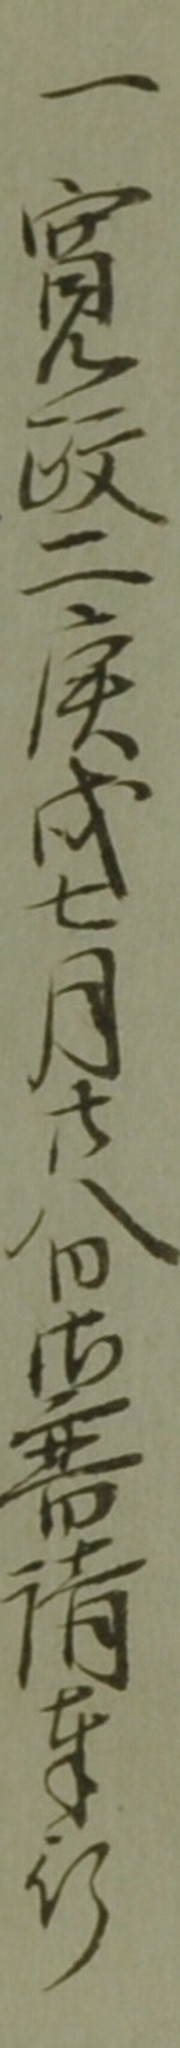一寛政二庚戌七月廿八日御普請奉行
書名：諸御役代々録（七）
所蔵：伊那市立高遠町図書館・合同会社AMANE
